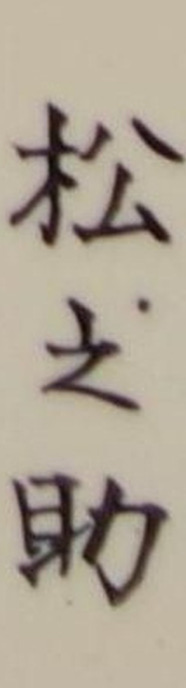松之助
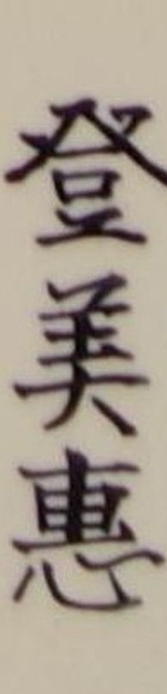登美恵
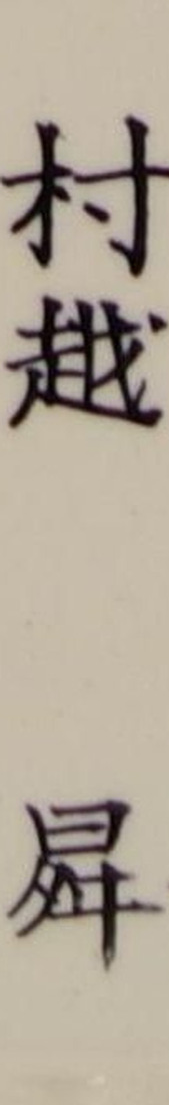村越昇
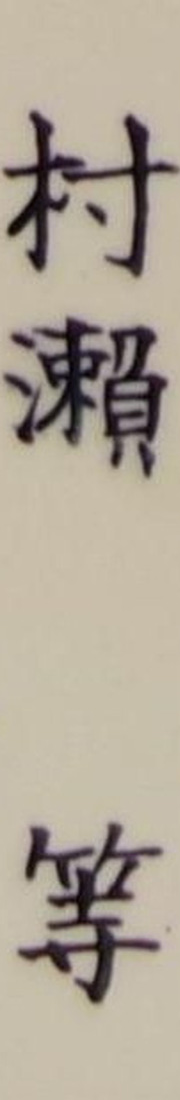村瀬等
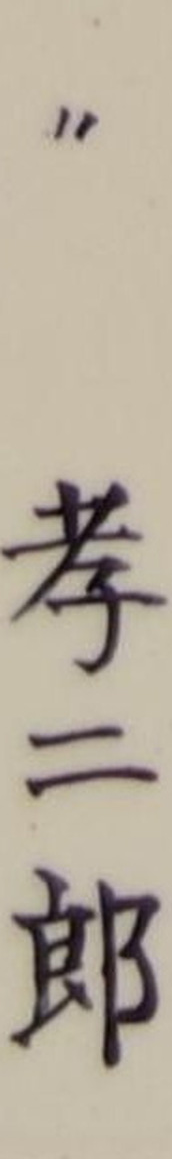孝二郎
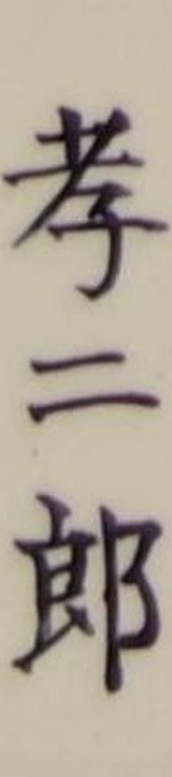孝二郎
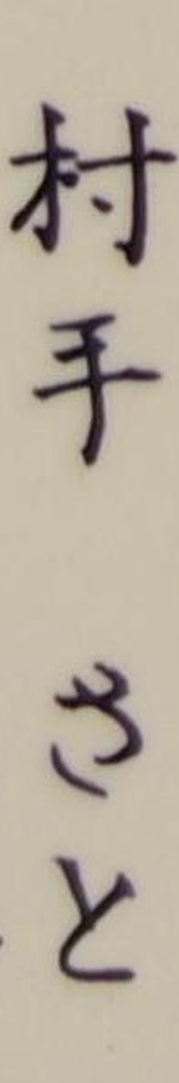村平さと
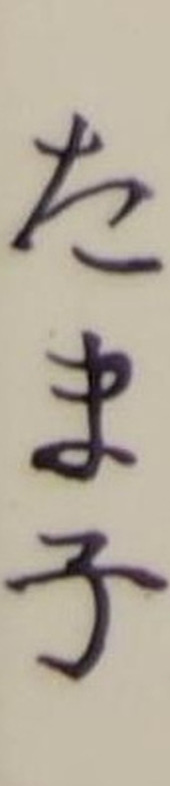たま子

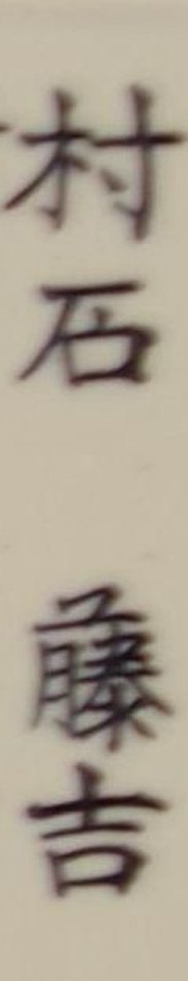村石藤吉
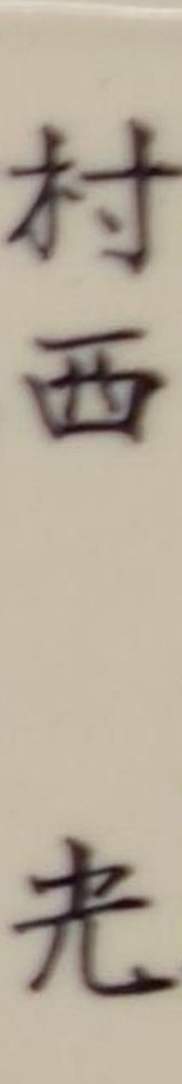村西光
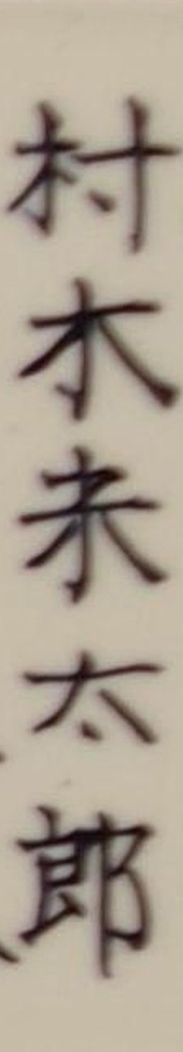村木米太郎
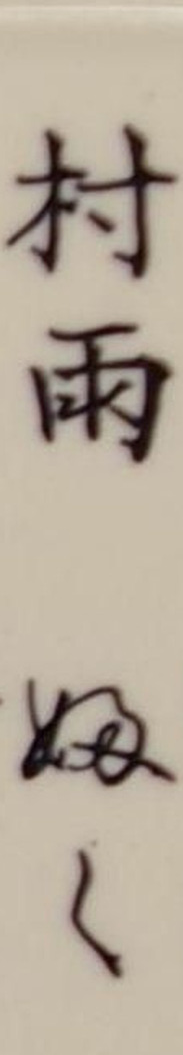村雨ふく
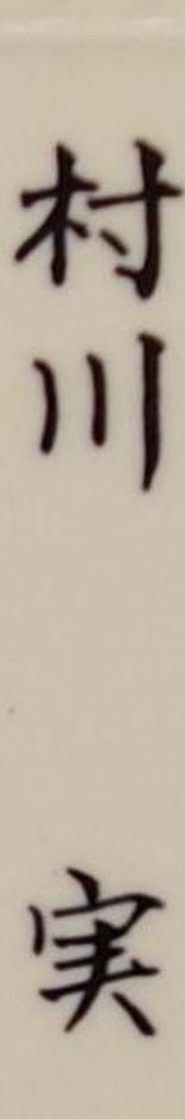村川実
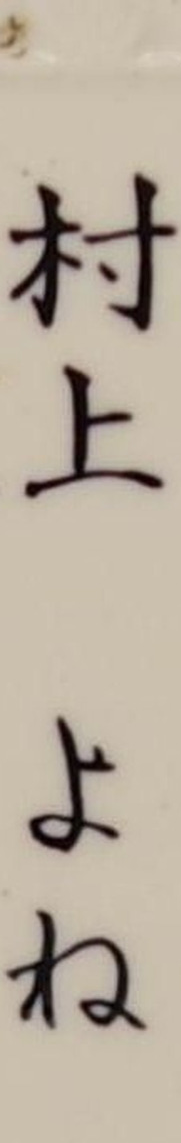村上よね
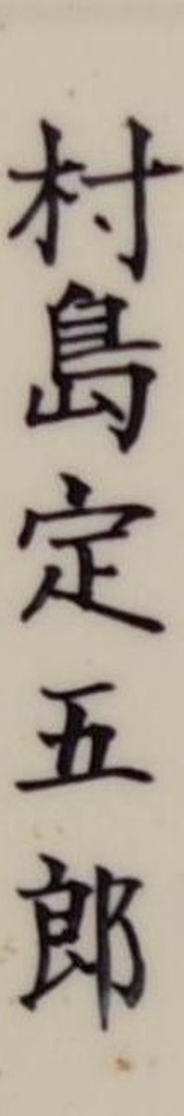村島定五郎
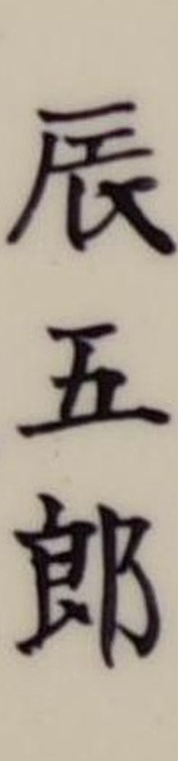辰五郎
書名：M~S
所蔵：高野山金剛峯寺
